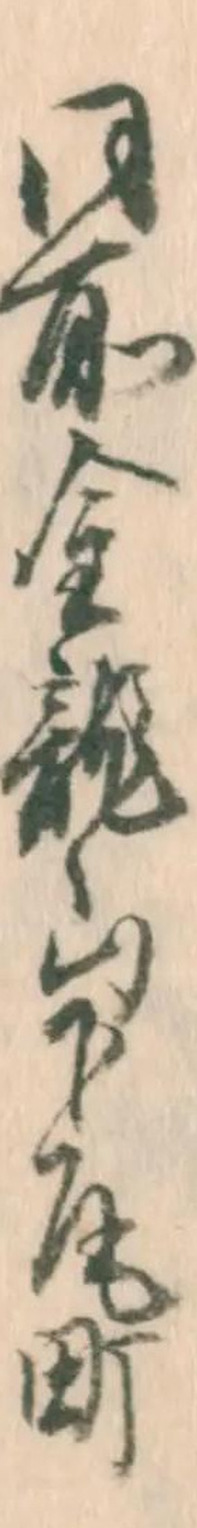同所金龍山下瓦町
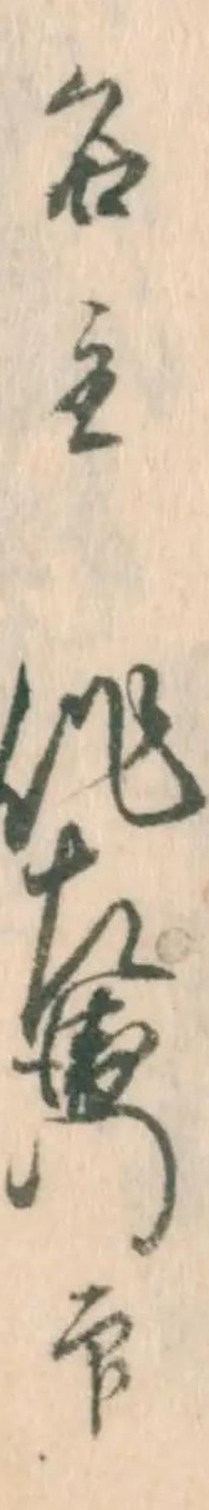名主作左衛門印
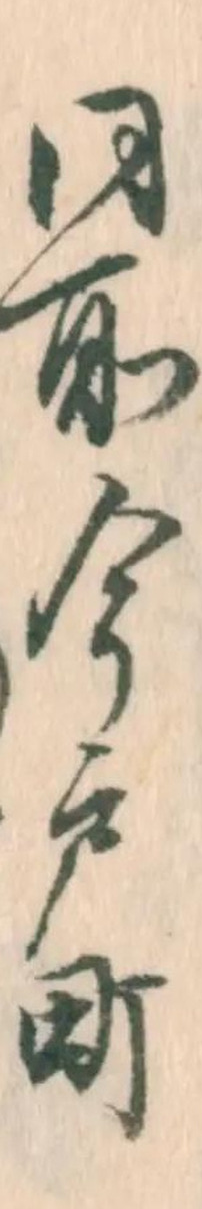同所今戸町
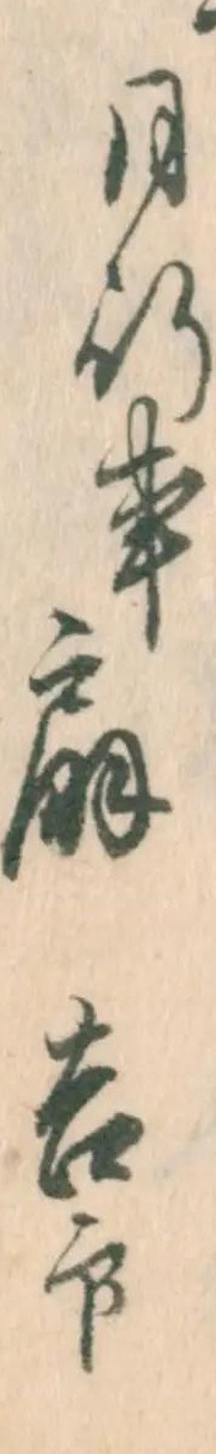月行事扇吉印
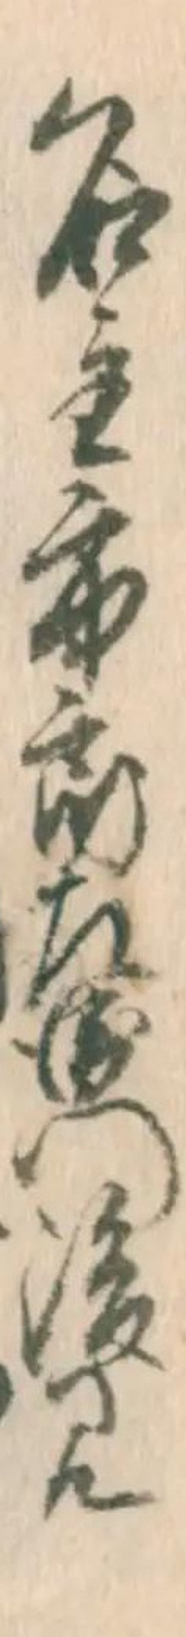名主市郎左衛門後見
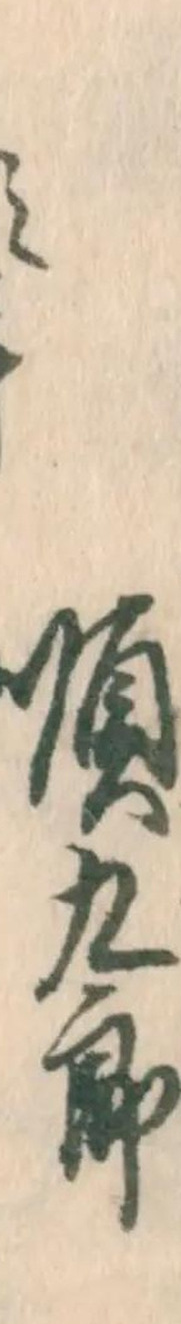順九郎

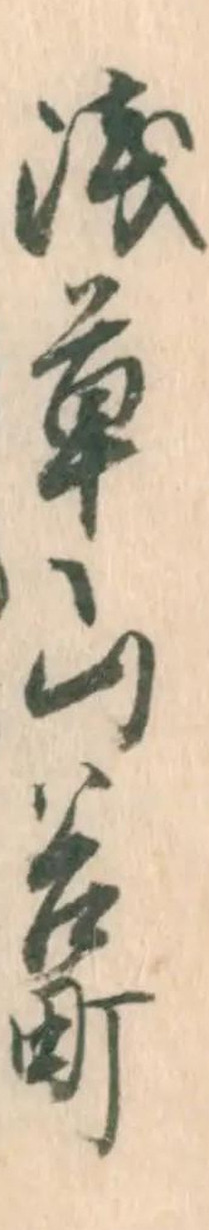浅草山谷町
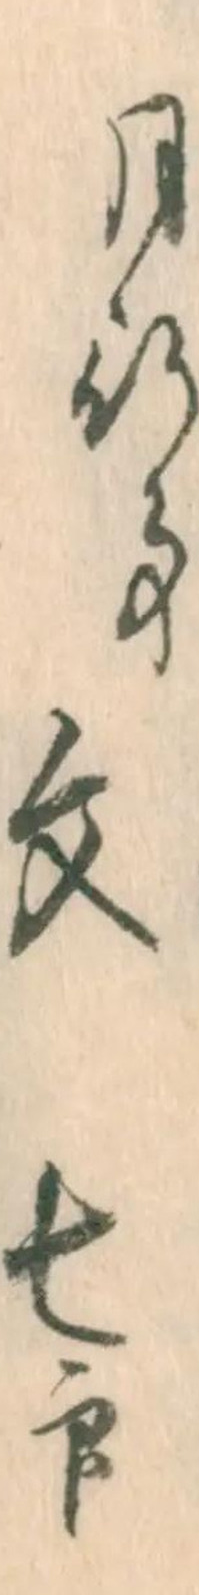月行事文七印
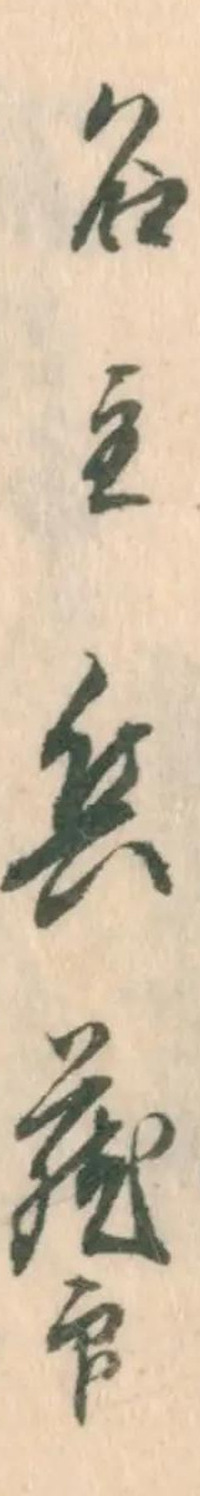名主兵蔵印
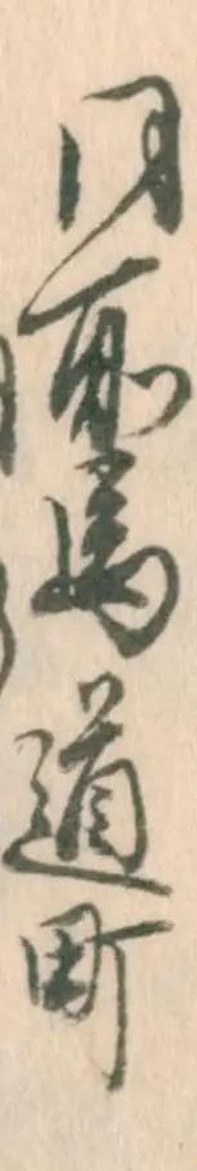同所馬道町
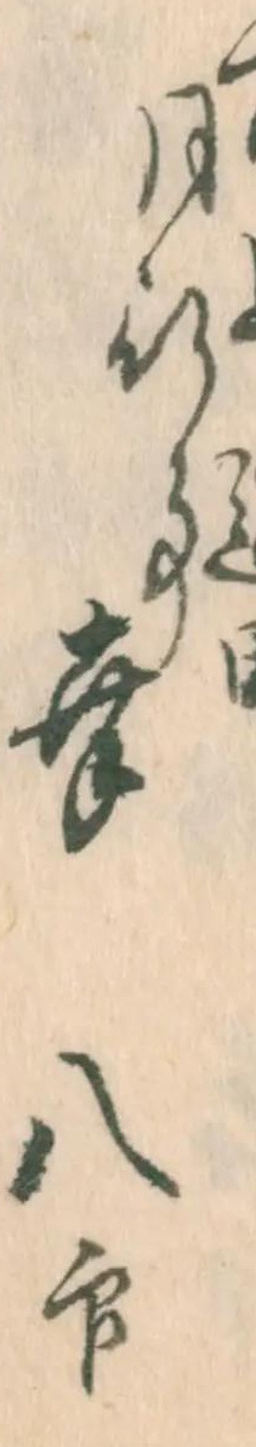月行事幸八印
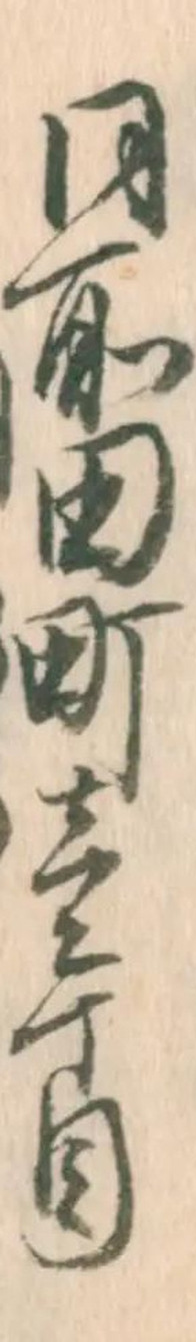同所田町壱丁目
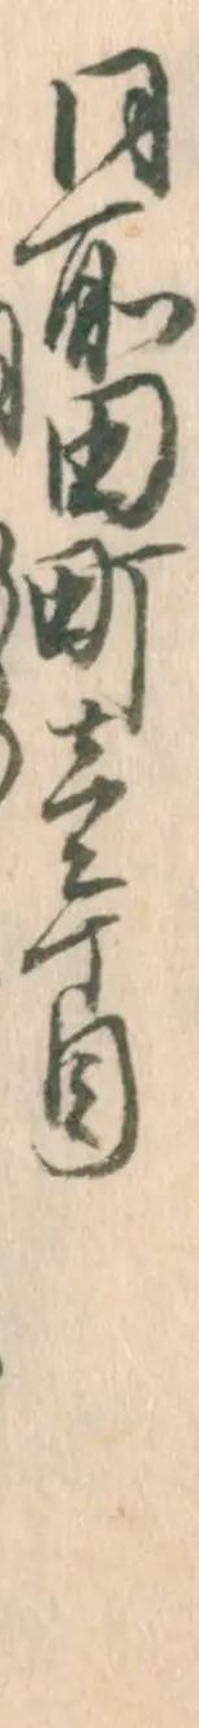同所田町壱丁目
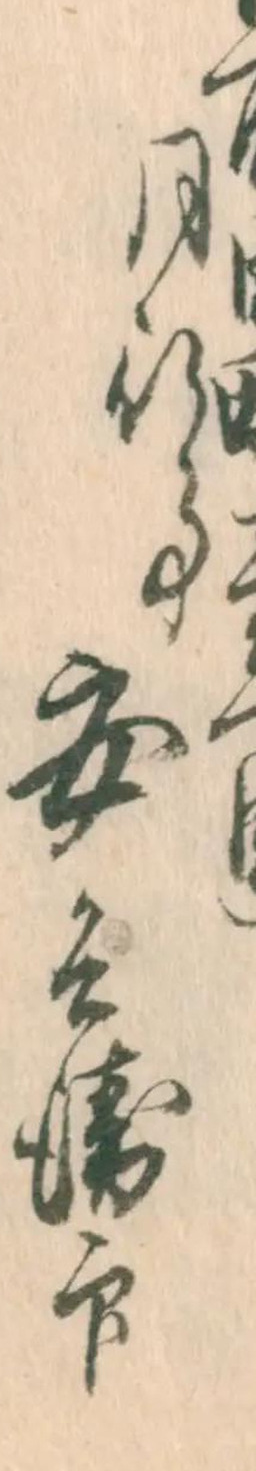月行事安兵衛印
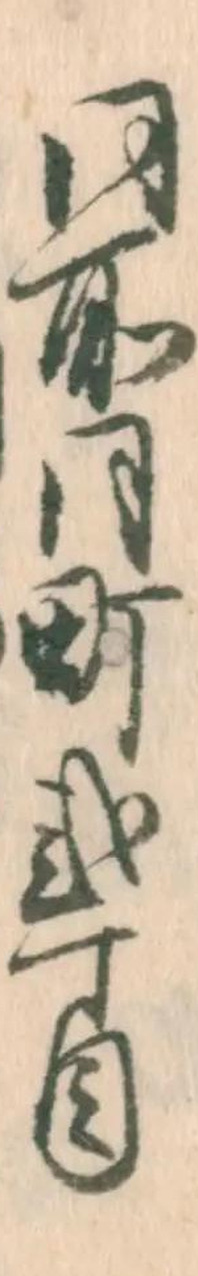同所同町弐丁目
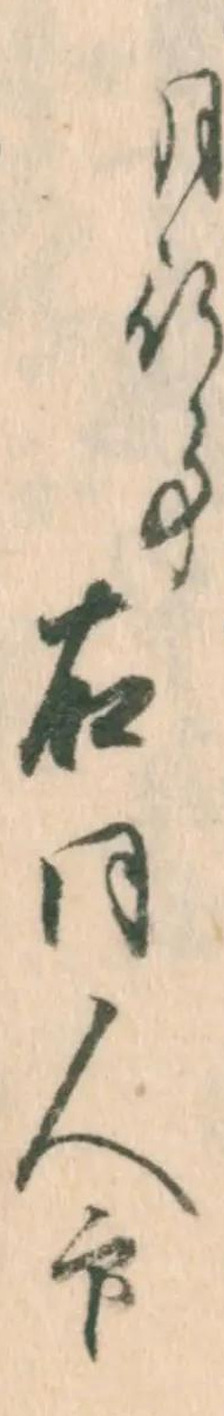月行事右同人印
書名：地震災書留 2巻. [2] 内表紙に「地震一件　安政二卯年十月」とあり
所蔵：国立国会図書館 National Diet Library, JAPAN
